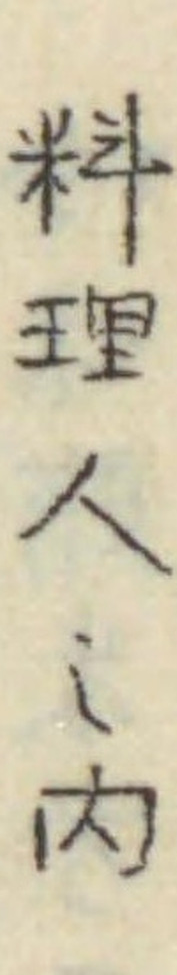料理人之内
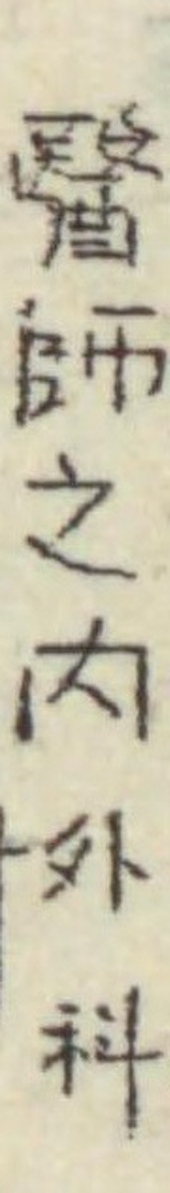医師之内外科
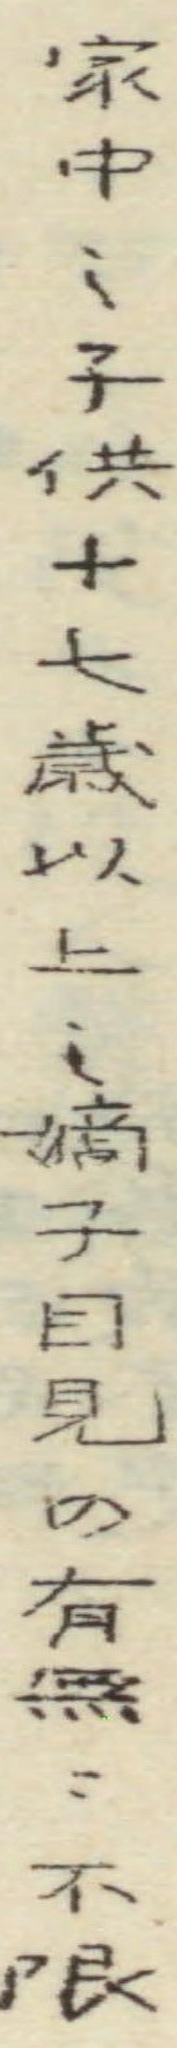家中之子供十七才以上之嫡子目見の有無二不限
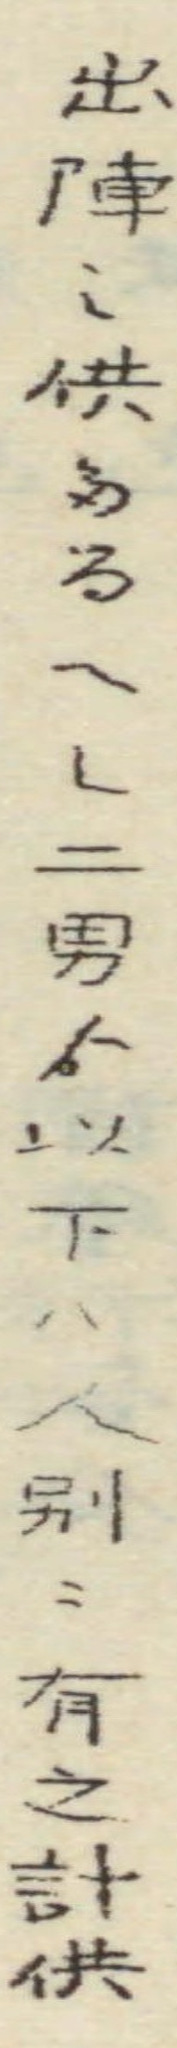出陣之供あるへし二男ゟ以下ハ人別二有之計供
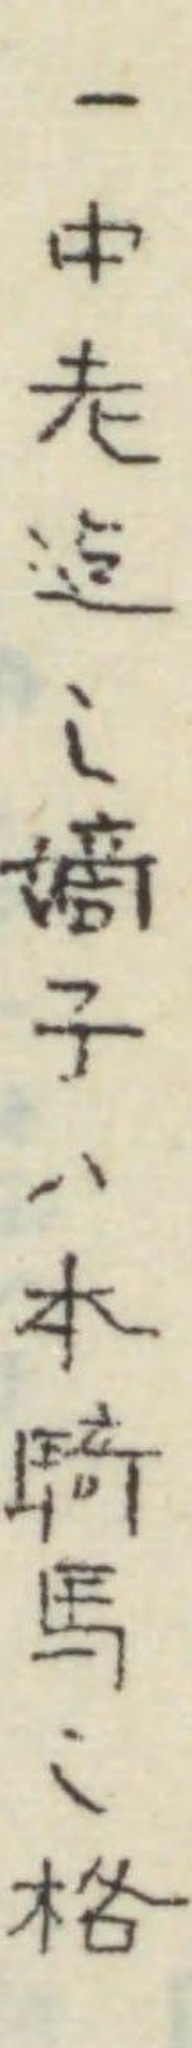一中老迄之嫡子ハ本騎馬之格
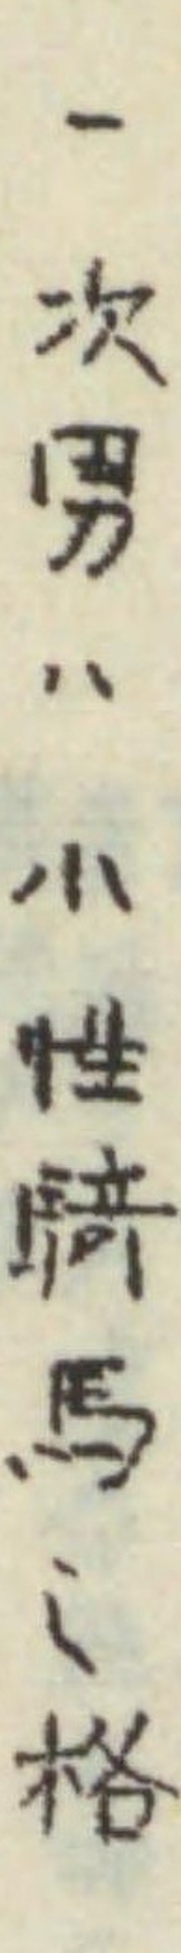一次男ハ小姓騎馬之格
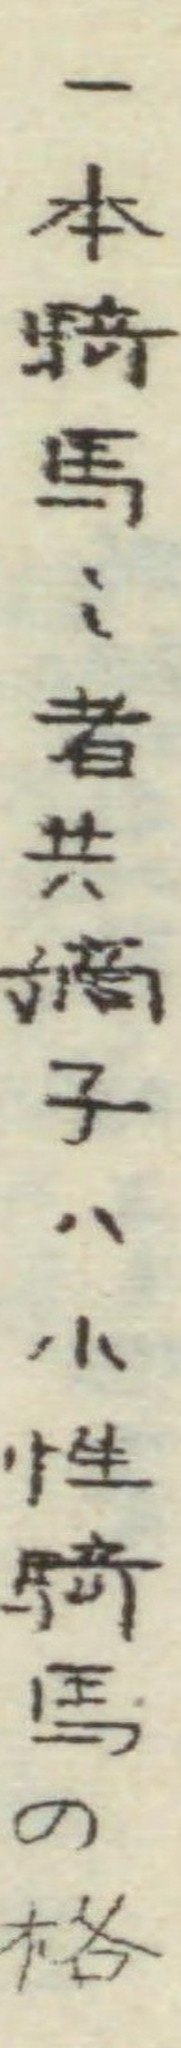一本騎馬之者共嫡子ハ小姓騎馬の格
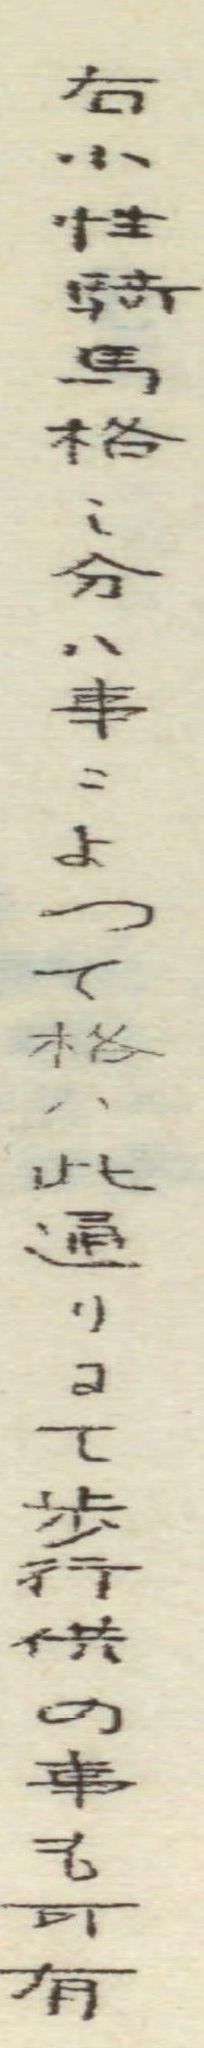右小姓騎馬格之分ハ事二よつて格ハ此通りにて歩行併の事も可有
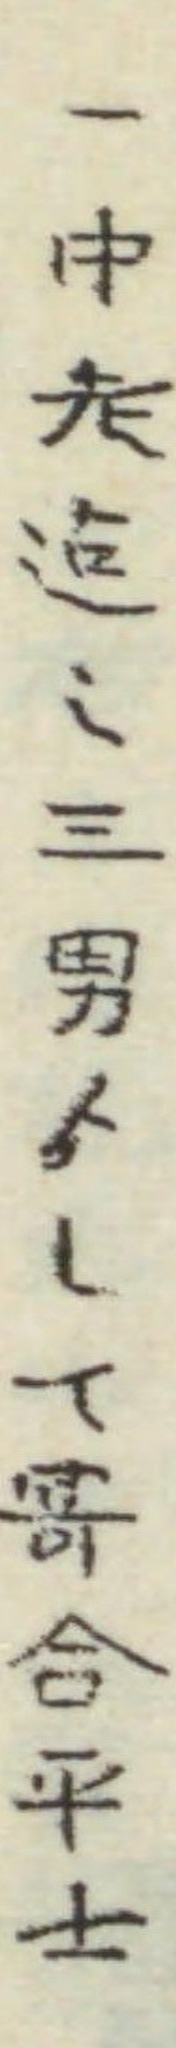一中老迄之三男ゟして寄合平士
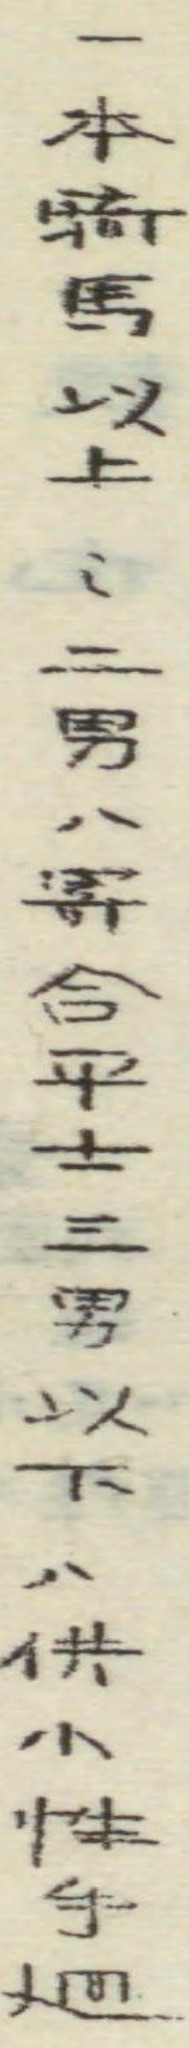一本騎馬以上之二男ハ寄合平士三男以下ハ併小姓手廻
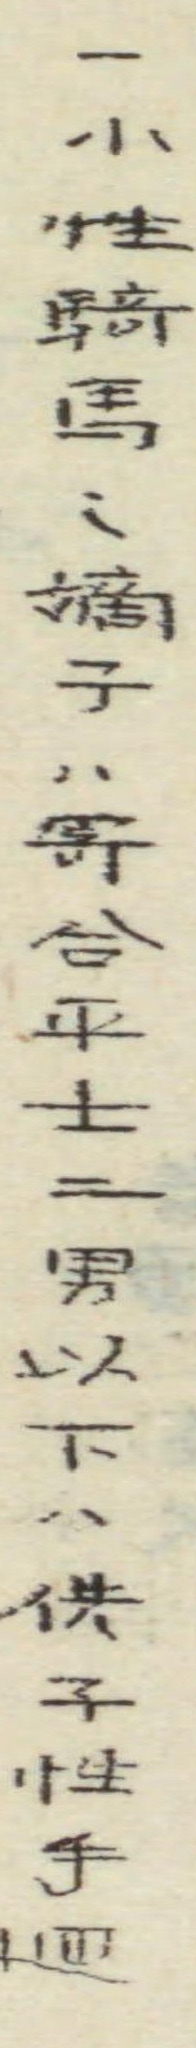一小姓騎馬之ｔｙ嫡子ハ寄合平士二男以下ハ供子性手廻
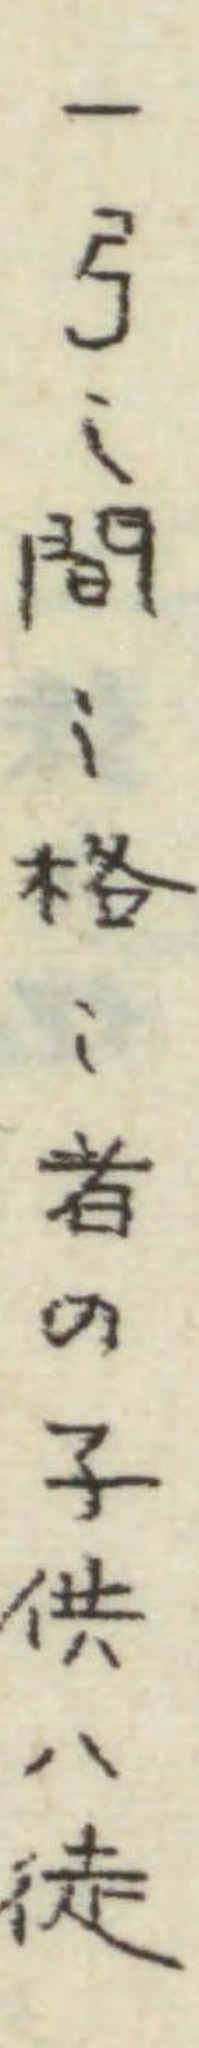一弓之間之格〃者の子供ハ徒

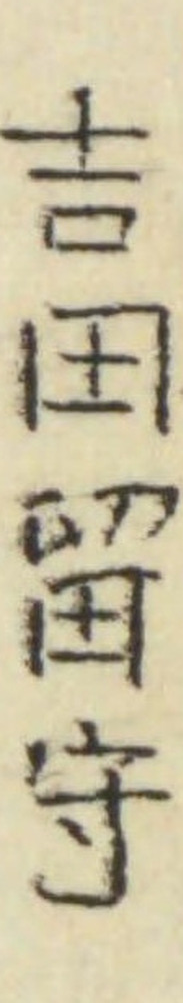吉田留守
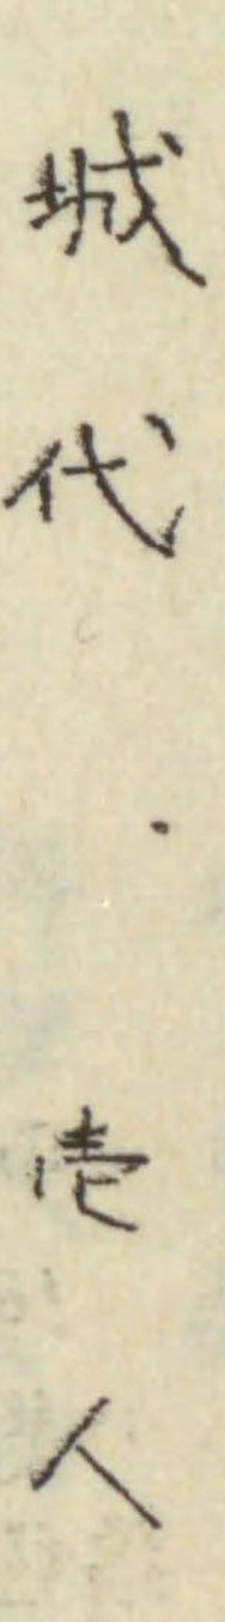城代壱人
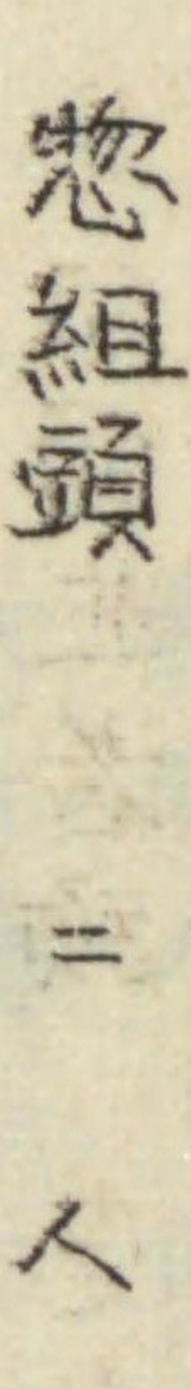惣組頭二人
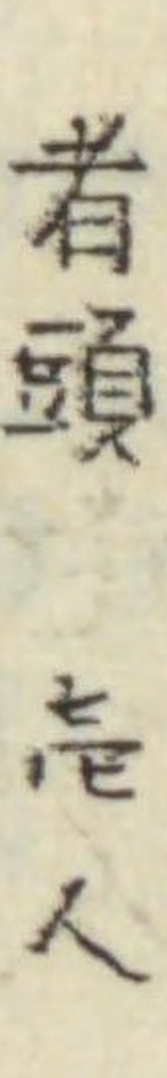者頭壱人
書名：三河吉田藩動員史料
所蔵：国立国会図書館 National Diet Library, JAPAN
